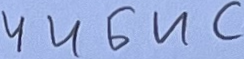чибис
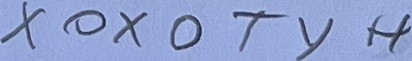хохотун
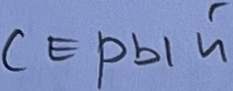серый
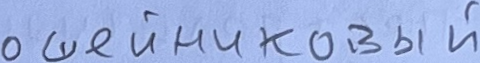ошейниковый
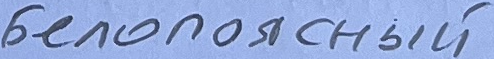белопоясный
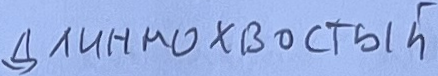длиннохвостый
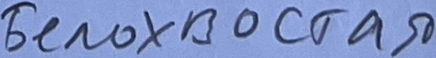белохвостая
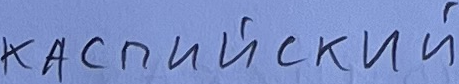каспийский
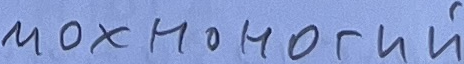мохноногий
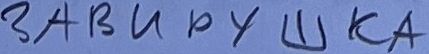завирушка
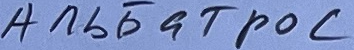альбатрос
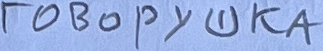говорушка
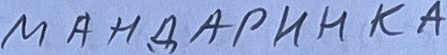мандаринка
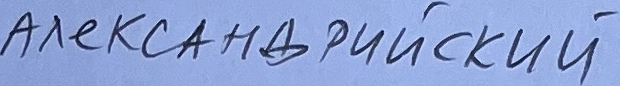александрийский
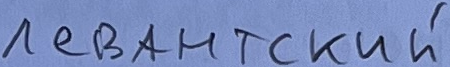левантский
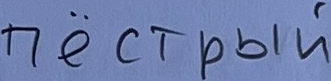пёстрый
